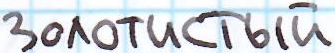золотистый
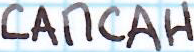сапсан
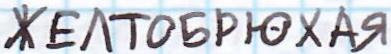желтобрюхая
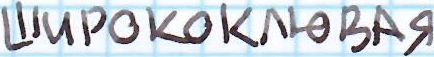ширококлювая
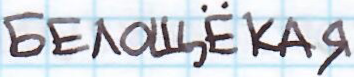белощёкая
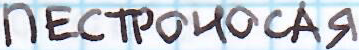пестроносая
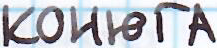конюга
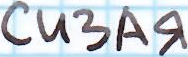сизая
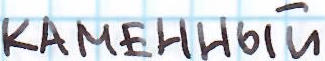каменный
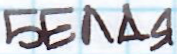белая
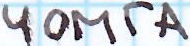чомга
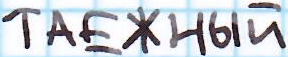таежный
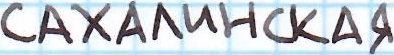сахалинская
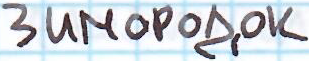зимородок
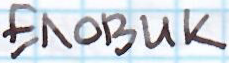еловик
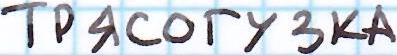трясогузка
